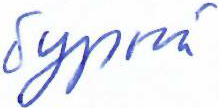бурый
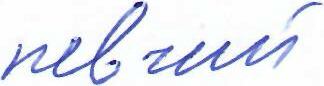певчий
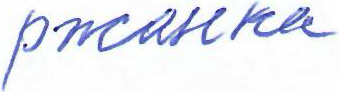ржанка
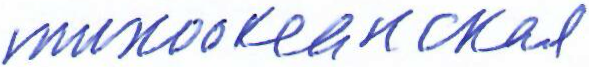тихоокеанская
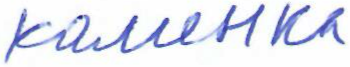каменка
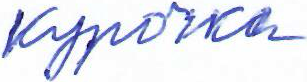курочка
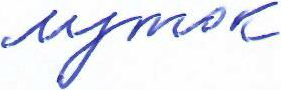луток
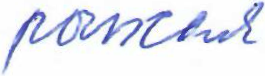рыжая
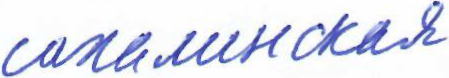сахалинская
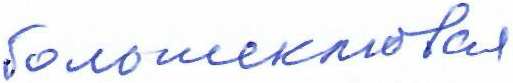большеклювая
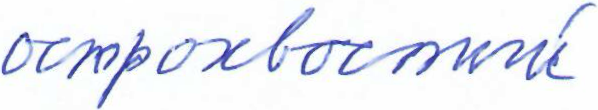острохвостый
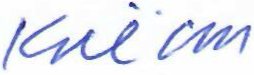клёст
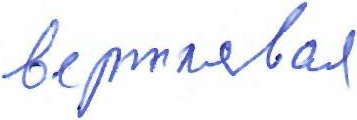вертлявая
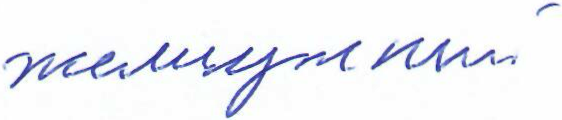жемчужный
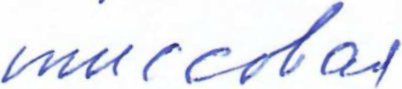тиссовая
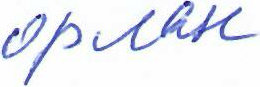орлан
